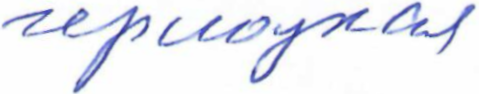черноухая
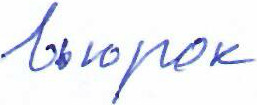вьюрок
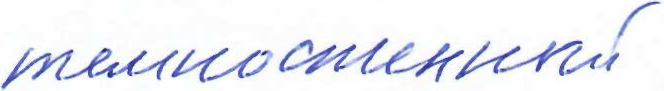темноспинный
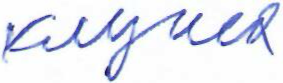клуша
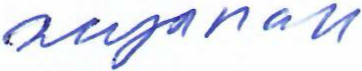жулпан
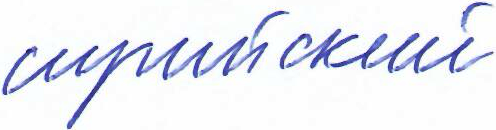сирийский
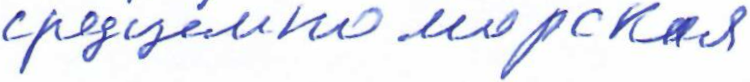средиземноморская
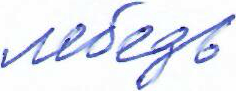лебедь
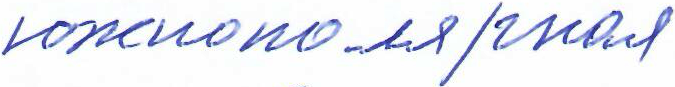южнополярная
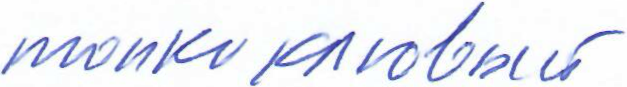тонкоклювый
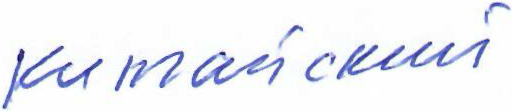китайский
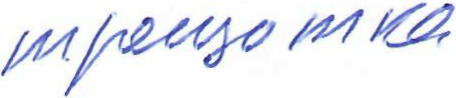трещотка
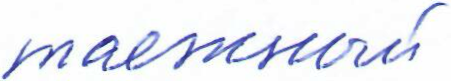таежный
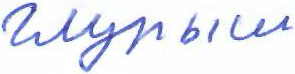глупыш
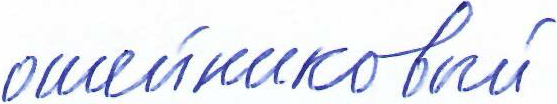ошейниковый
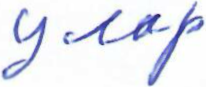улар
